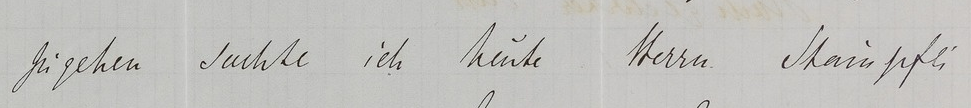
zugehen suchte ich heute Herrn Stämpfli
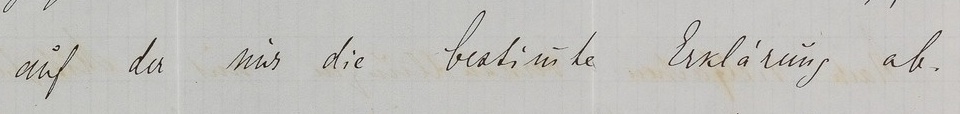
auf der mir die bestimmte Erklärung ab-
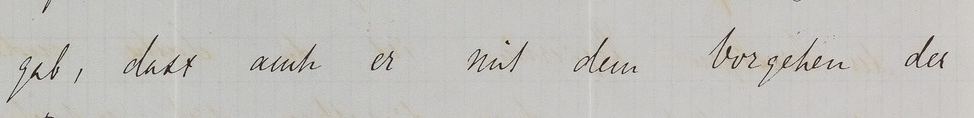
gab, dass auch er mit dem Vorgehen der
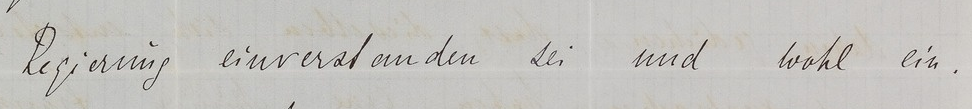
Regierung einverstanden sei und wohl ein-
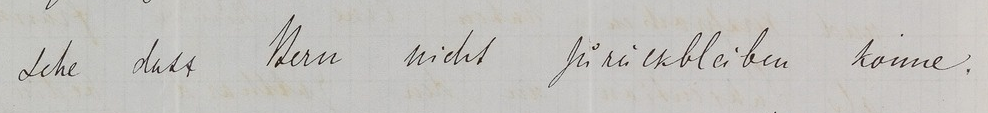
sehe dass Bern nicht zurückbleiben könne.
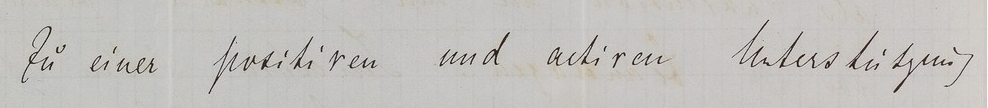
Zu einer positiven und activen Unterstützung
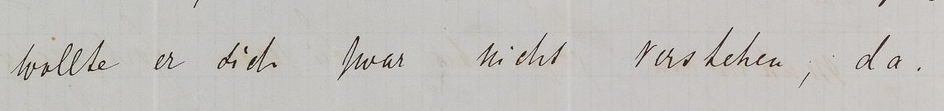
wollte er sich zwar nicht verstehen, da-
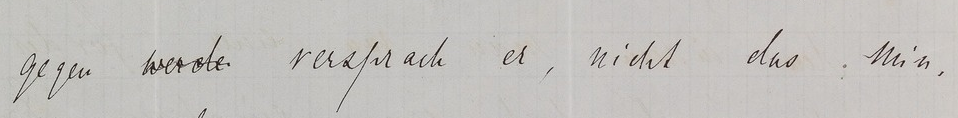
gegen werde versprach er, nicht das min-
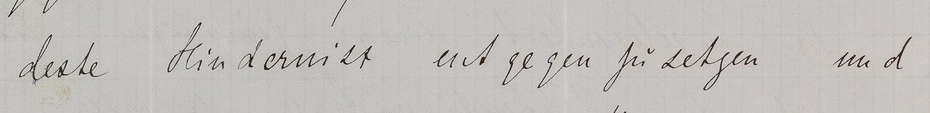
deste Hinderniss entgegenzusetzen und
